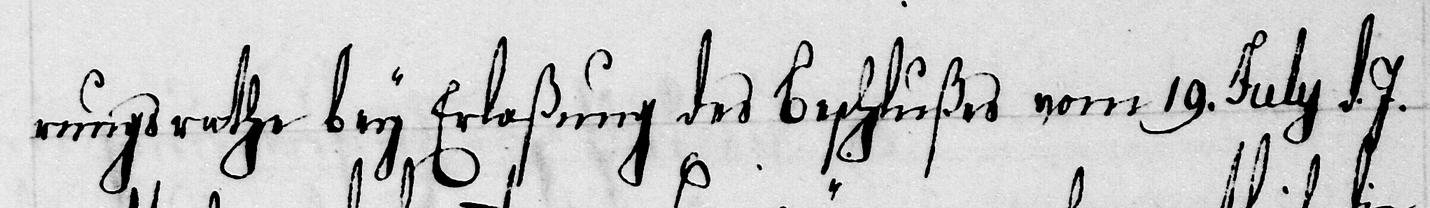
rungsrathe bey Erlaßung des Beschlußes vom 19. July d.
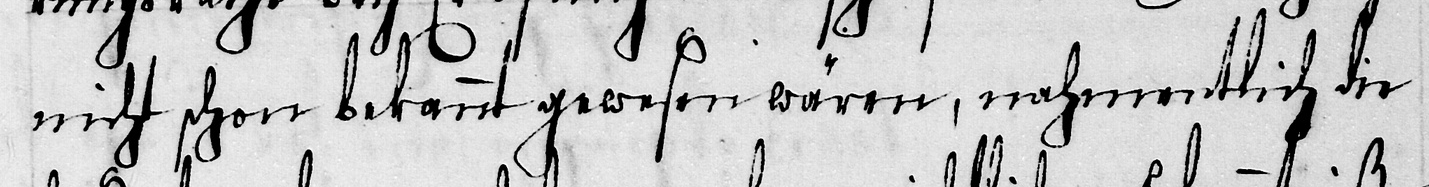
nicht schon bekannt gewesen wären, nahmentlich die
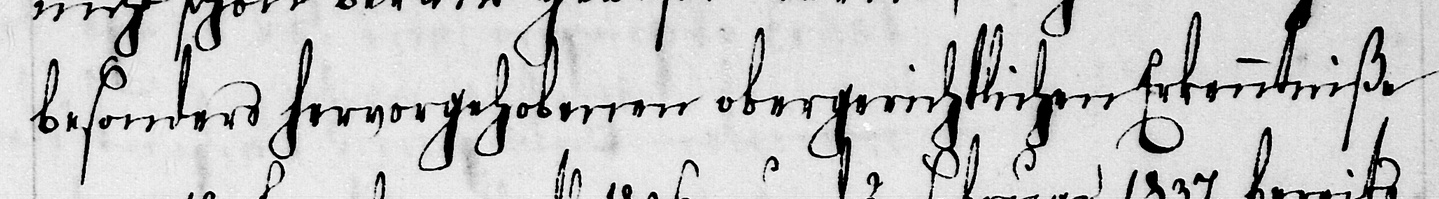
besonders hervorgehobenen obergerichtlichen Erkenntniße
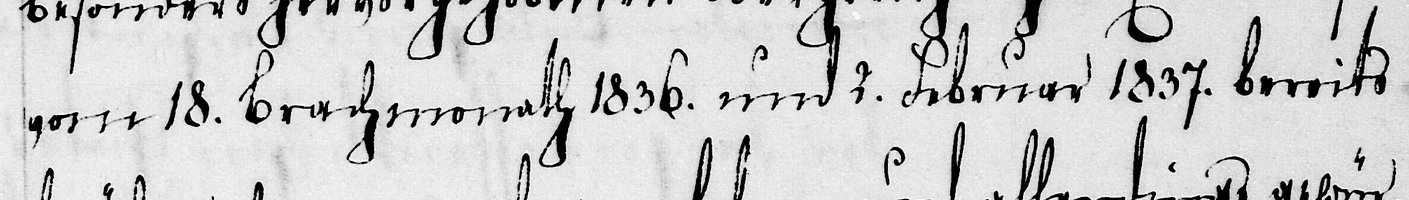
vom 18. Brachmonath 1836. und 2. Februar 1837. bereits
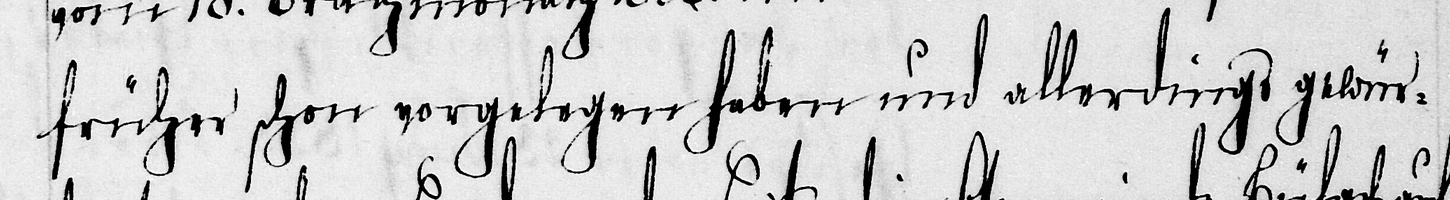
früher schon vorgelegen haben und allerdings gewür¬
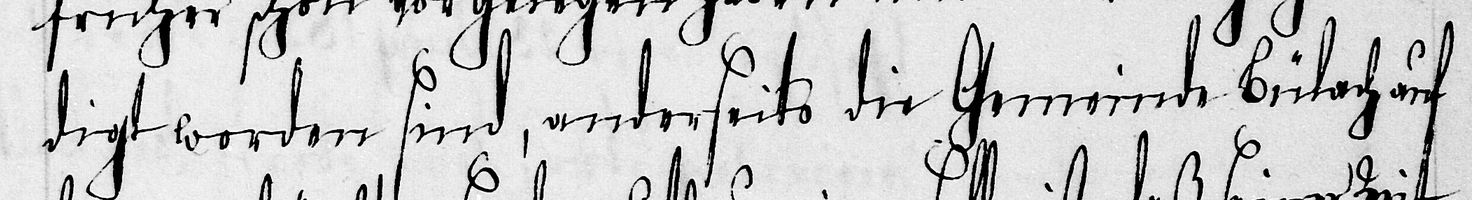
digt worden sind, anderseits die Gemeinde Bülach auf
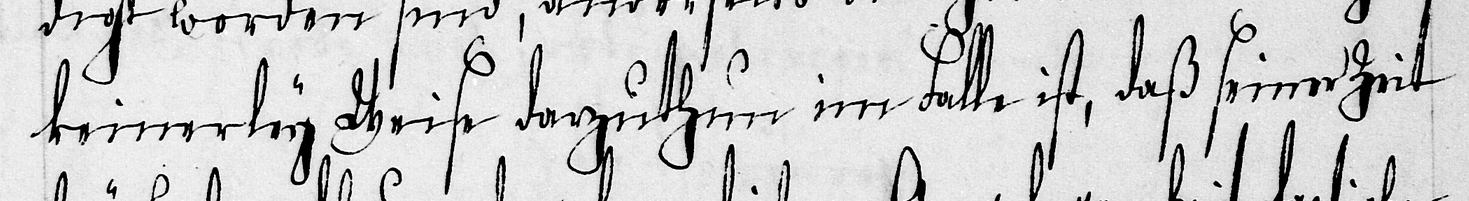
keinerley Weise darzuthun im Falle ist, daß seiner
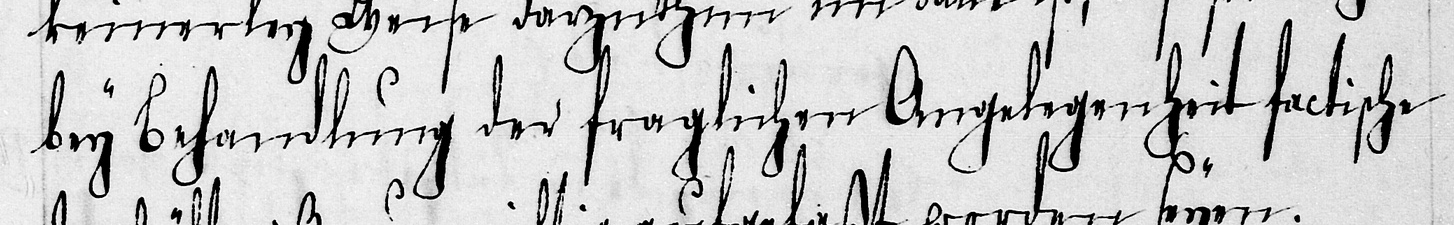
bey Behandlung der fraglichen Angelegenheit facti¬
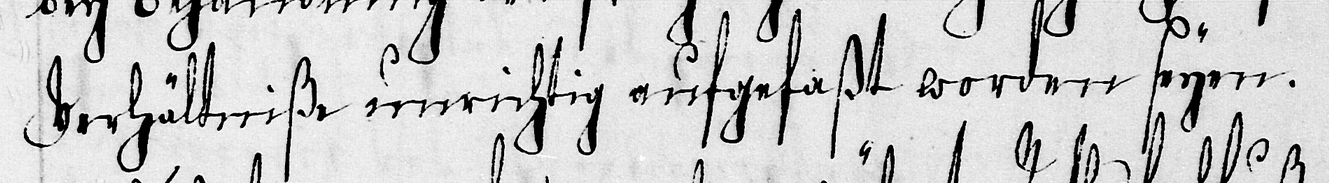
Verhältniße unrichtig aufgefaßt worden seyen.
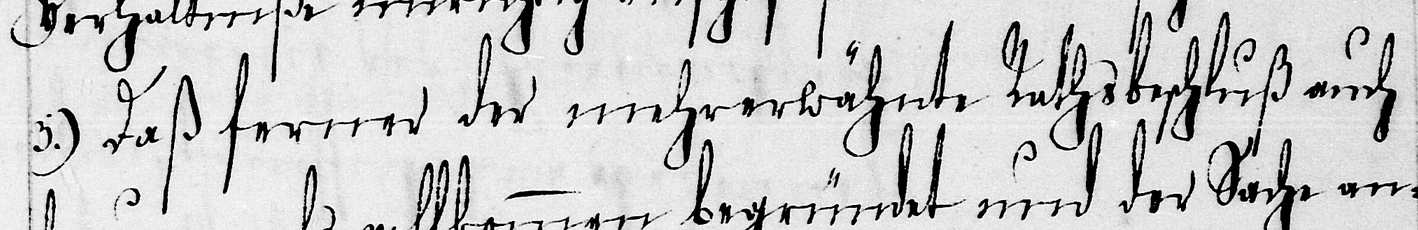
3.) Daß ferner der mehrerwähnte Rathsbeschluß auch
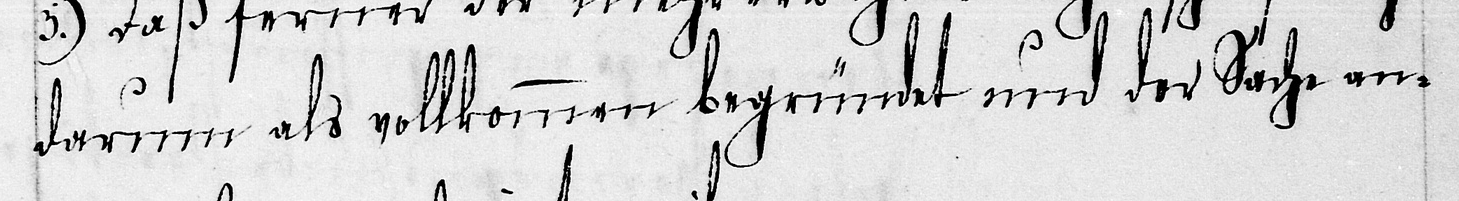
darum als vollkommen begründet und der Sache an¬
